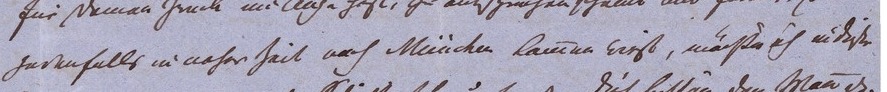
jedenfalls in naher Zeit nach München kommen wirst, möchte ich in dieser
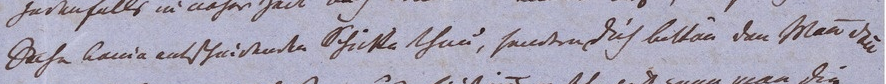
Sache keine entscheidenden Schritte thun, sondern Dich bitten den Mann dann
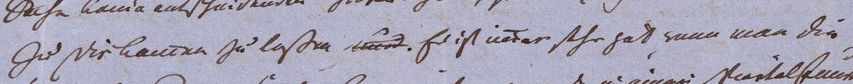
zu Dir kommen zu laßen .... Es ist immer sehr gut, wenn man die
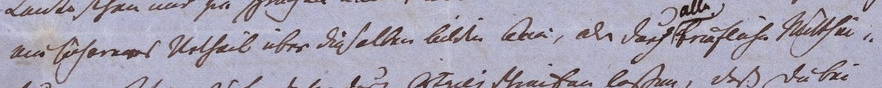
ein Sichereres Urtheil über dieselben bilden kann, als durch alle briefliche Mitthei-
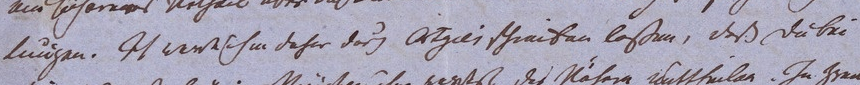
lungen. Ich werde ihm daher durch Otgies schreiben laßen, daß Du bei
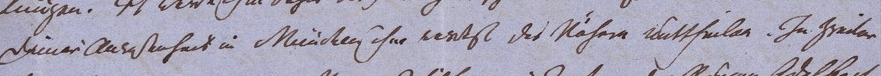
Deiner Anwesenheit in München ihm werdest das Nähere mittheilen. In Zweiter
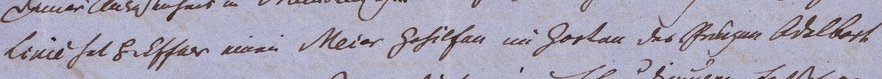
Linie hat Hr. Effner einen Meier Gehilfen im Garten des Prinzen Adelbert
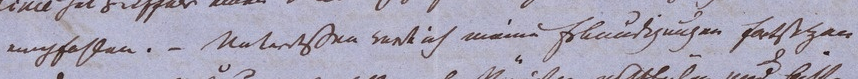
empfohlen. – Unterdeßen werde ich meine Erkundigungen fortsetzten
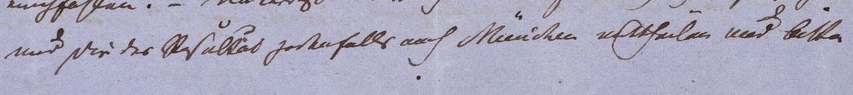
und Dir das Resultat jedenfalls nach München mittheilen und bitte
